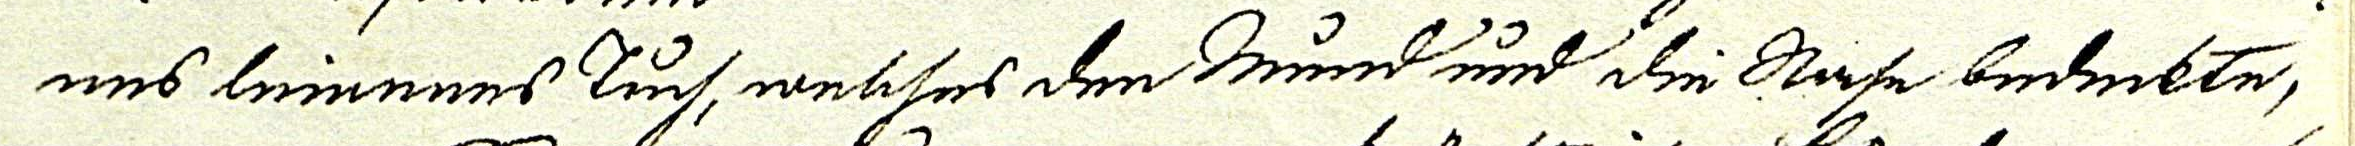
nes leinenes Tuch, welches den Mund und die Nase bedekte,
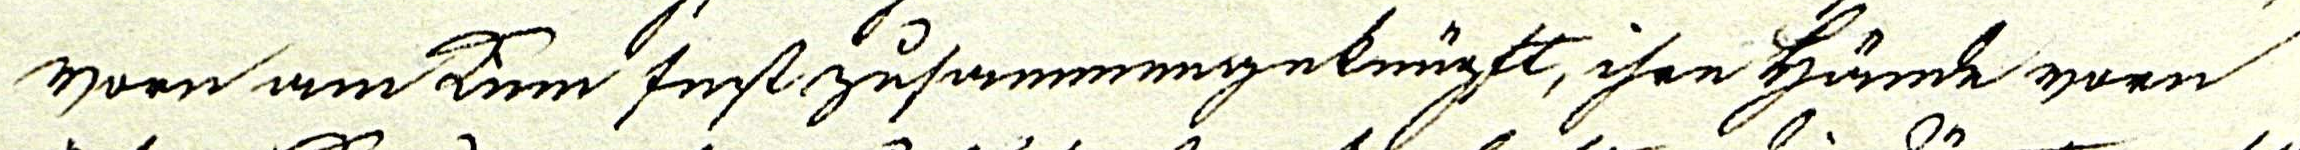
vorn am Kinn fest zusammengeknüpft, ihre Hände vorn
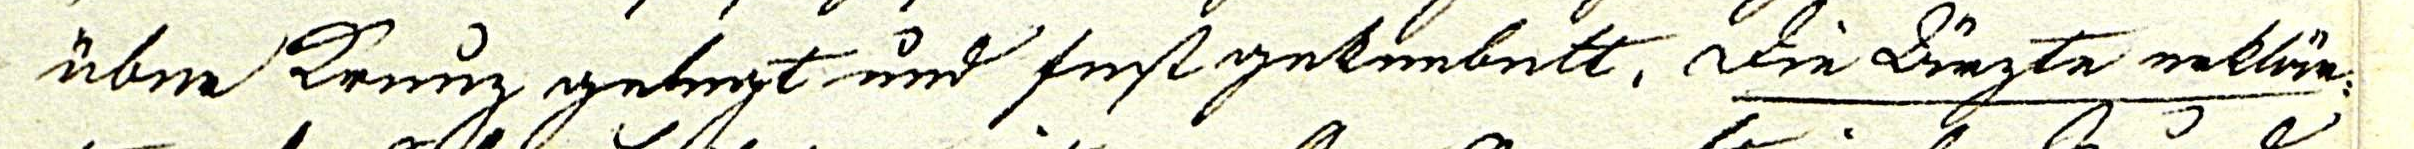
über Kreuz belegt und fest geknebelt, die Ärzte erklär¬
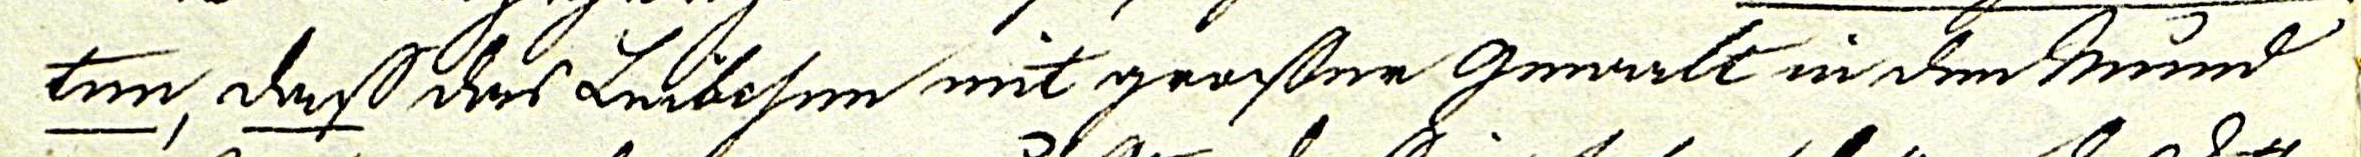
ten, daß das Leibchen mit großer Gewat in dem Mund
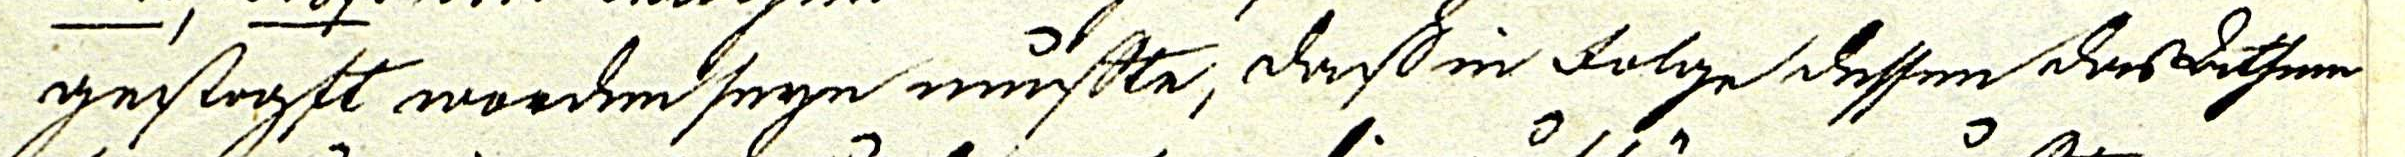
gestopft worden seyn mußte, daß in Folge dessen das Athmen
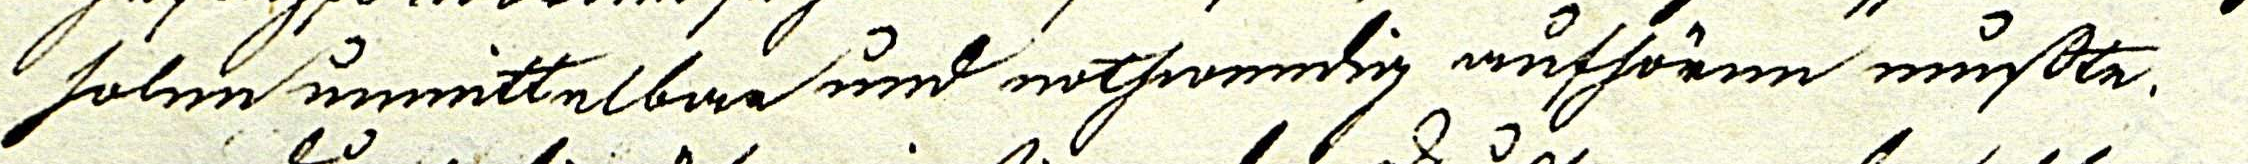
holen unmittelbar und nothwendig aufhöre mußte.
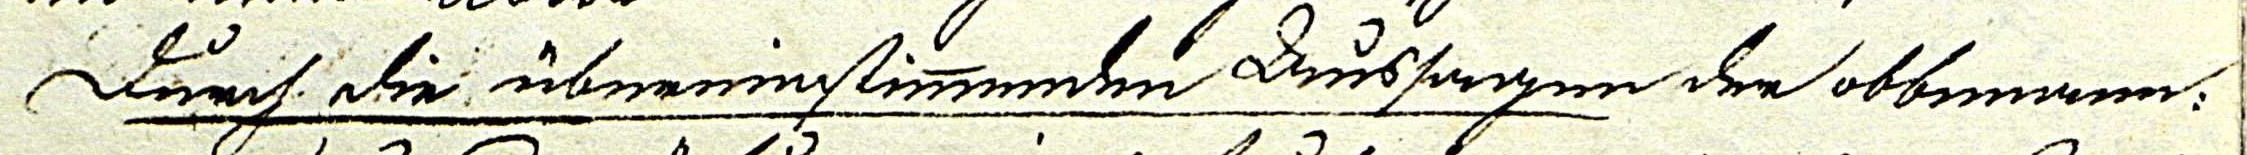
Durch die übereinstimmenden Aussagen der obbenann¬
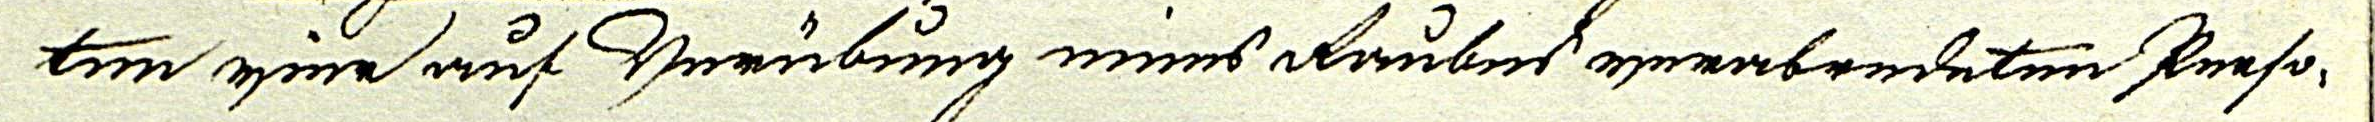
ten vier auf Verübung eines Raubes verabredeten Perso¬
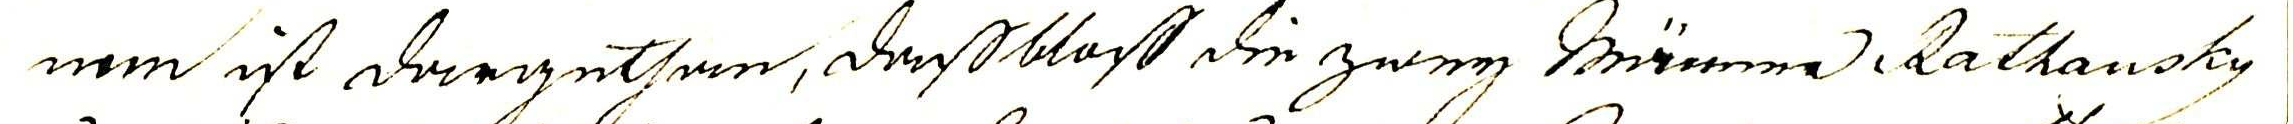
nen ist dargethan, daß bloß die zwei Männer Rathausky
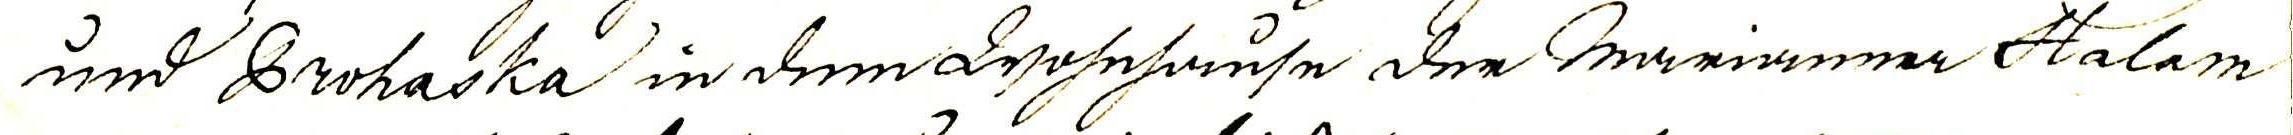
und Prohaska in dem Wohnhause der Marianna Halam
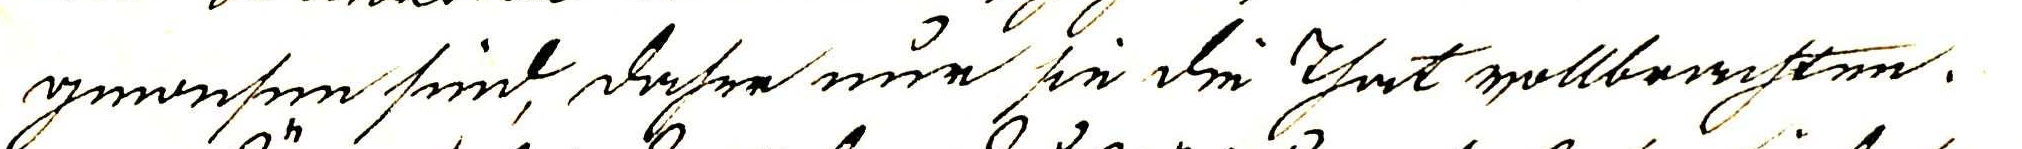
gewesen sind, daher nur sie die That vollbrachten.
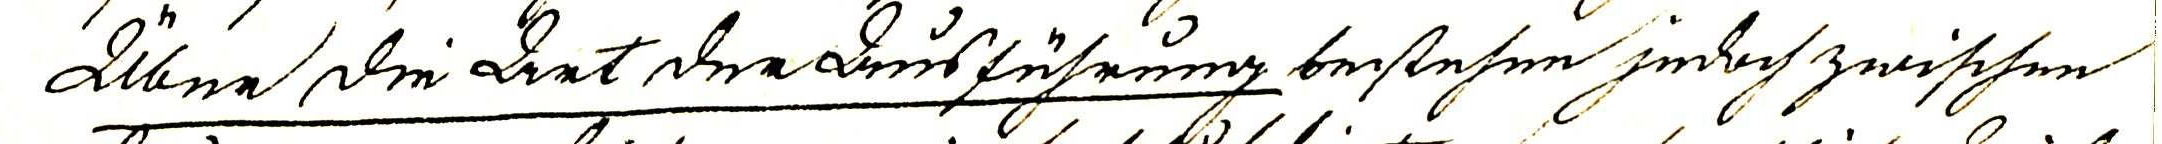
Über die Art der Ausführung bestehen jedoch zwischen
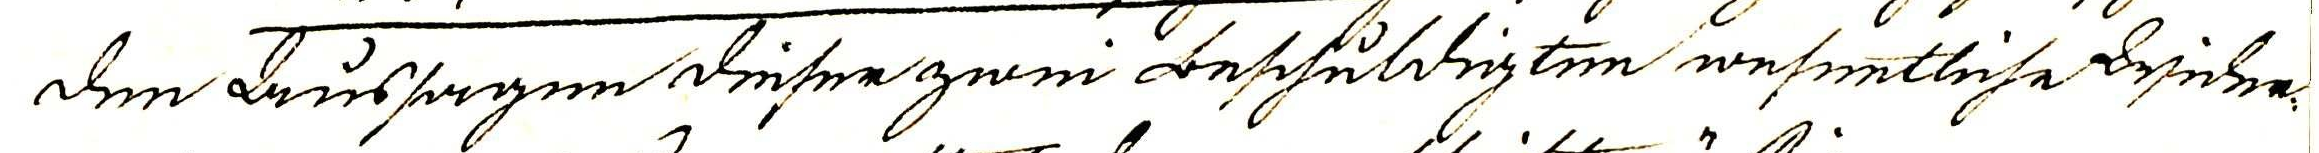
den Aussagen dieser zwei Beschuldigten wesentliche Wider¬
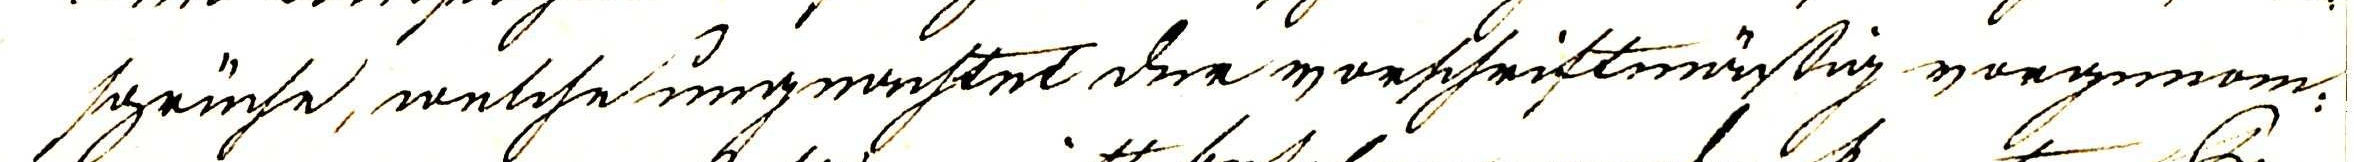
sprüche, welche ungeachtet der vorschriftmäßig vorgenom¬
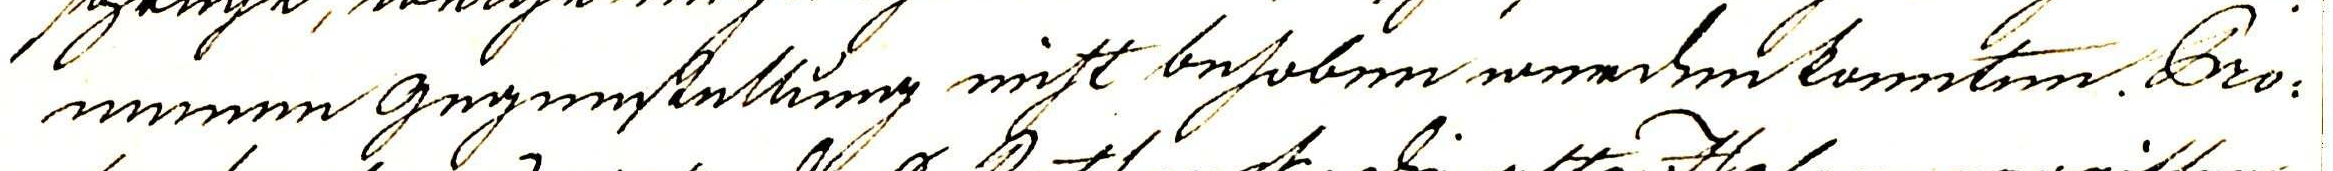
menen Gegenstellung nicht behoben werden konnten. Pro¬
